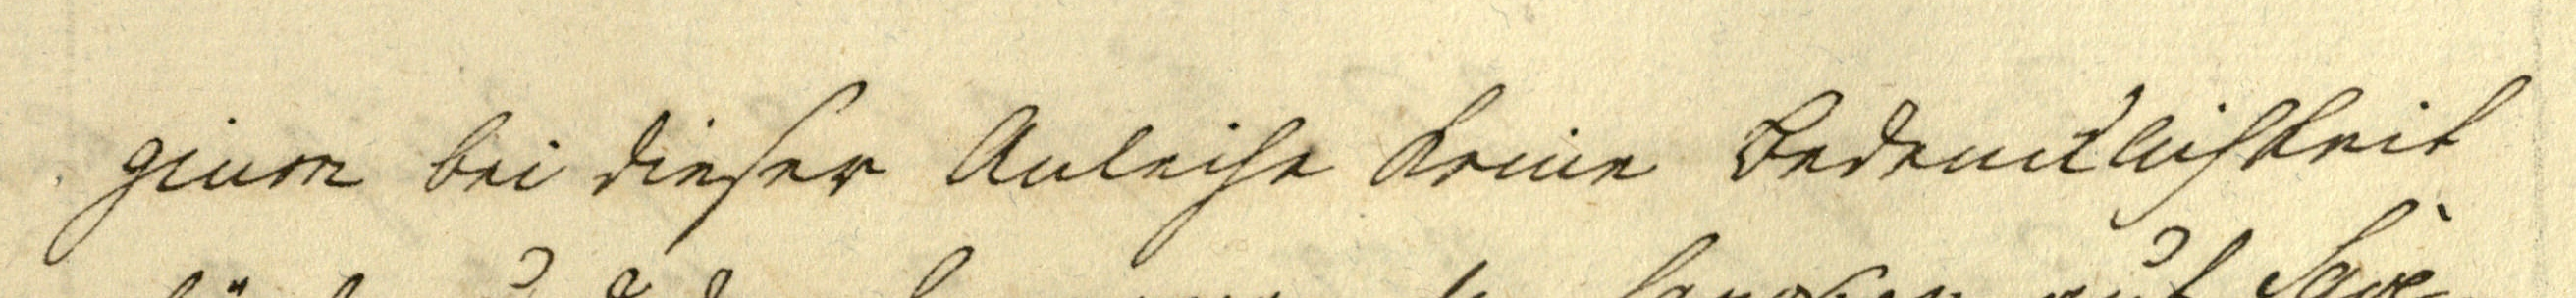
gium bei dieser Anleihe keine Bedencklichkeit
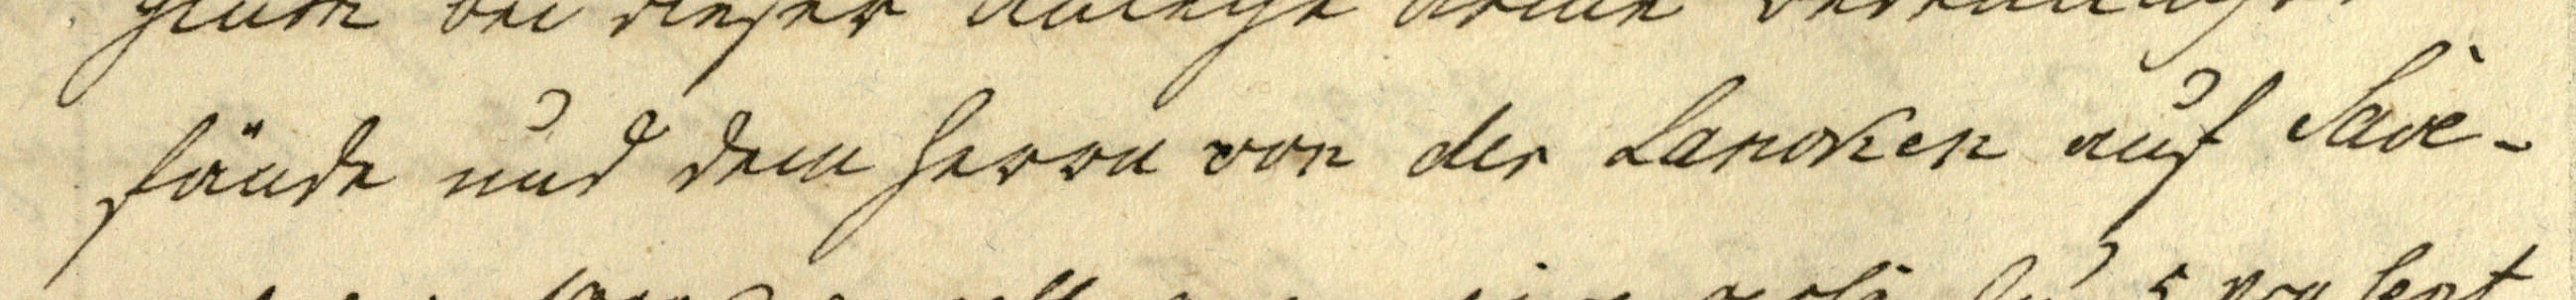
fände und dem Herrn von der Lancken auf Save¬
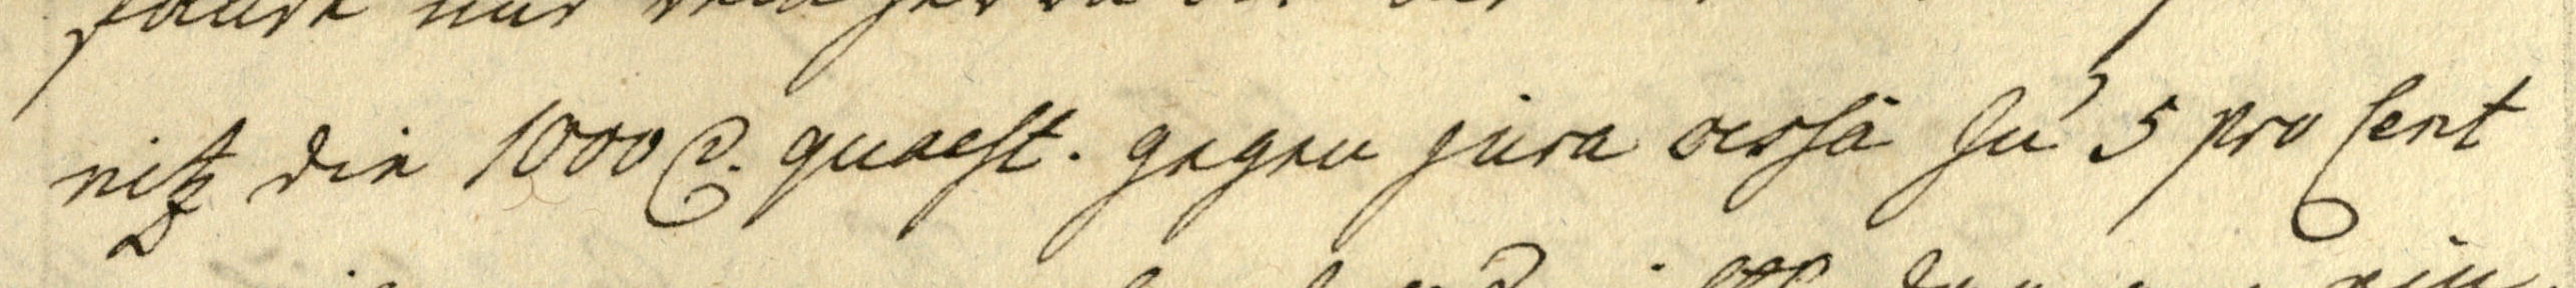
nitz die 1000 l. quaest. gegen jura cessa zu 5 pro cent
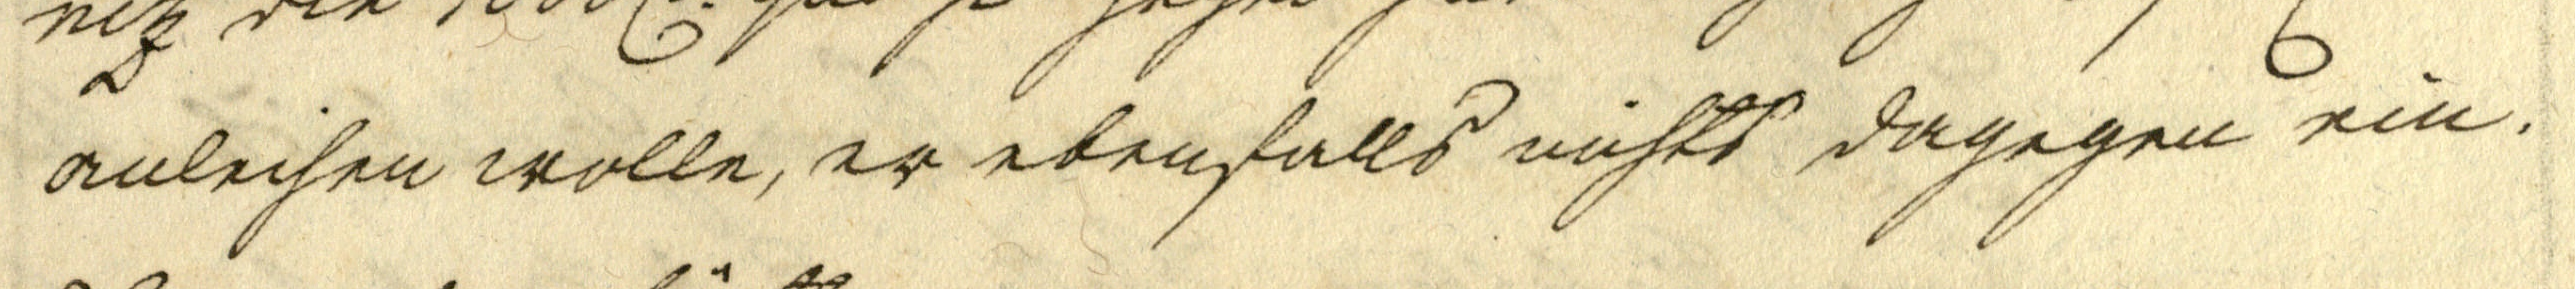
anleihen wolle, er ebenfalls nichts dagegen ein¬
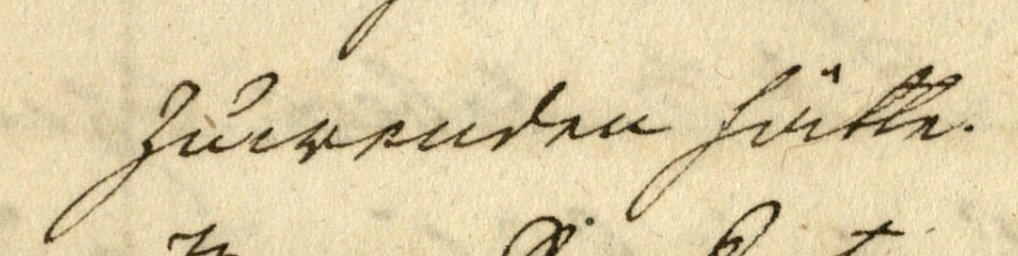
zuwenden hätte.
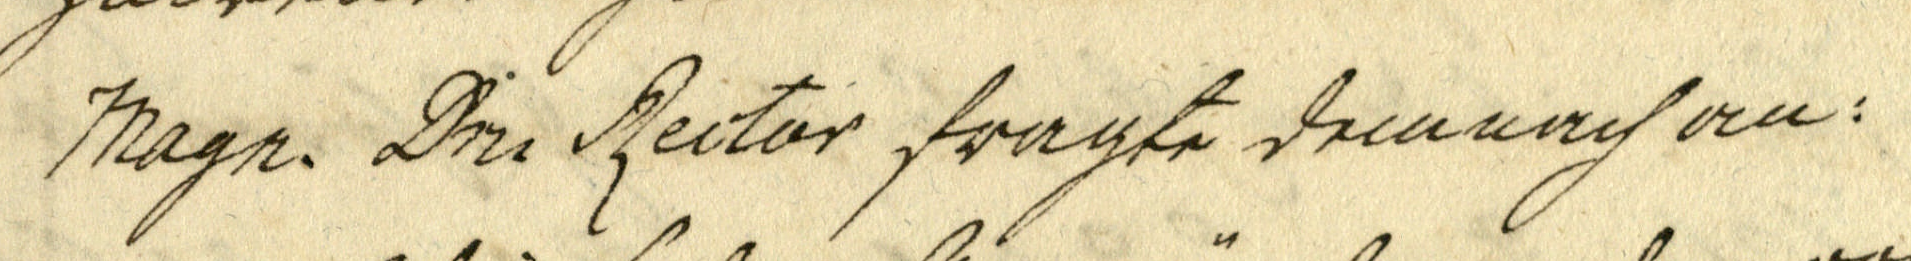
Magn. Dn. Rector fragte demnach an:
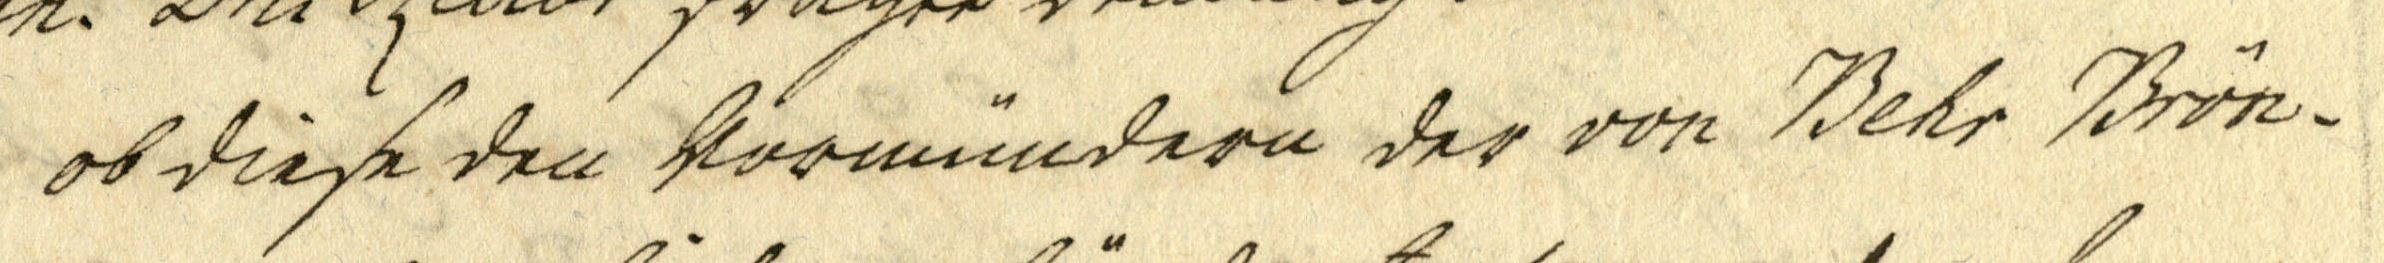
ob diese den Vormündern der von Behr Brön
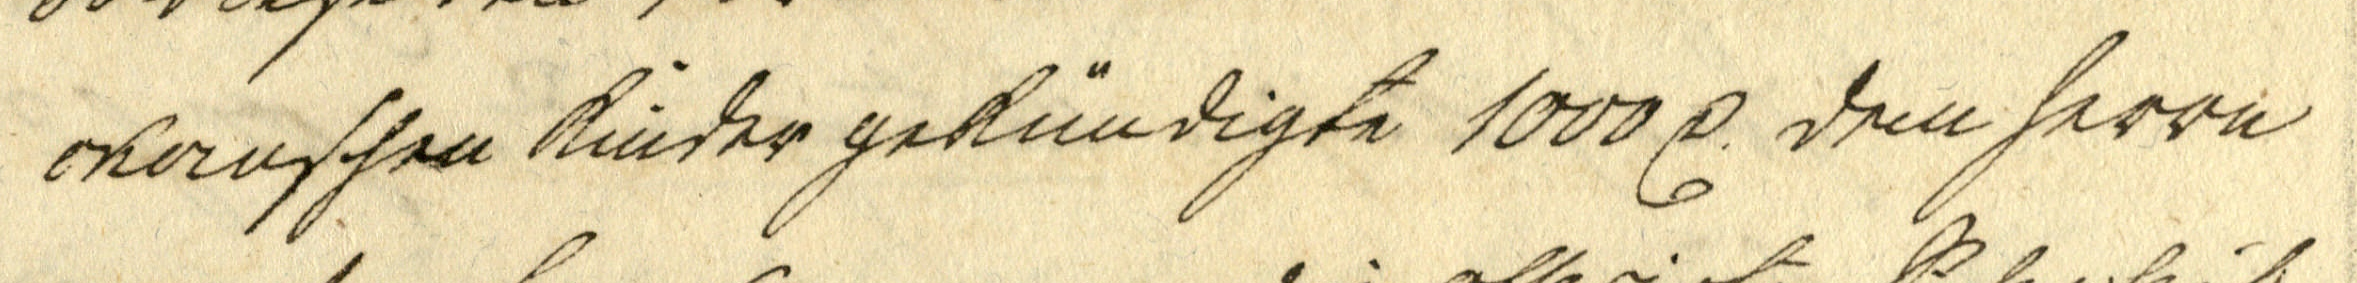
ckernschen Kinder gekündigte 1000 l. dem Herrn
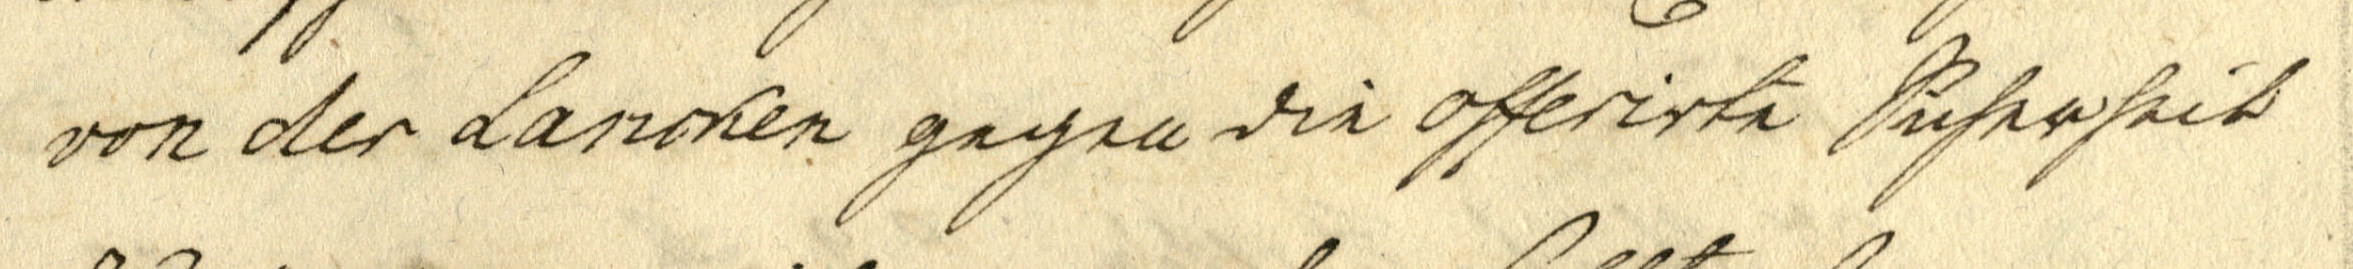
von der Lancken gegen die offerirte Sicherheit
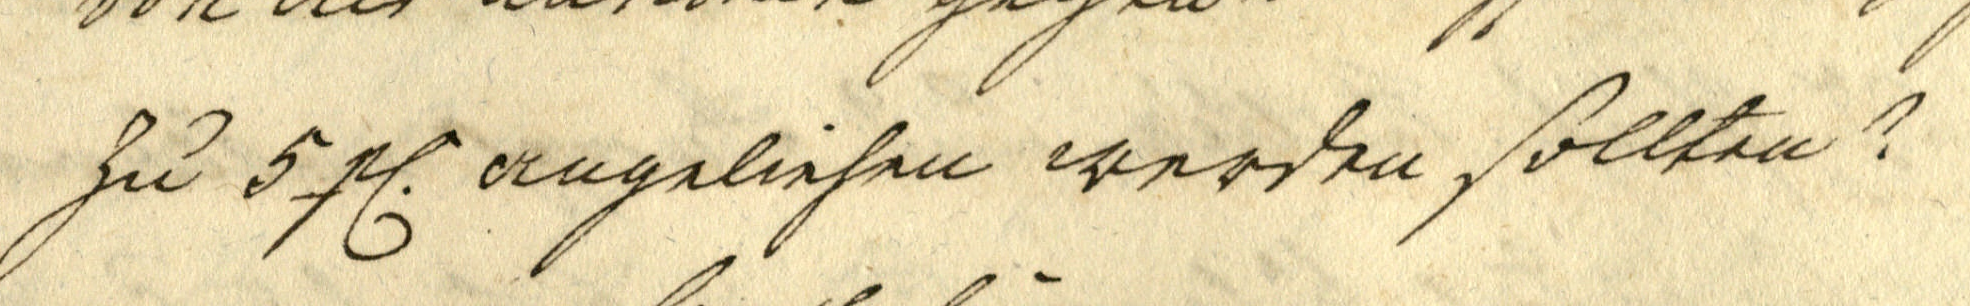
zu 5 pl. angeliehen werden sollten?
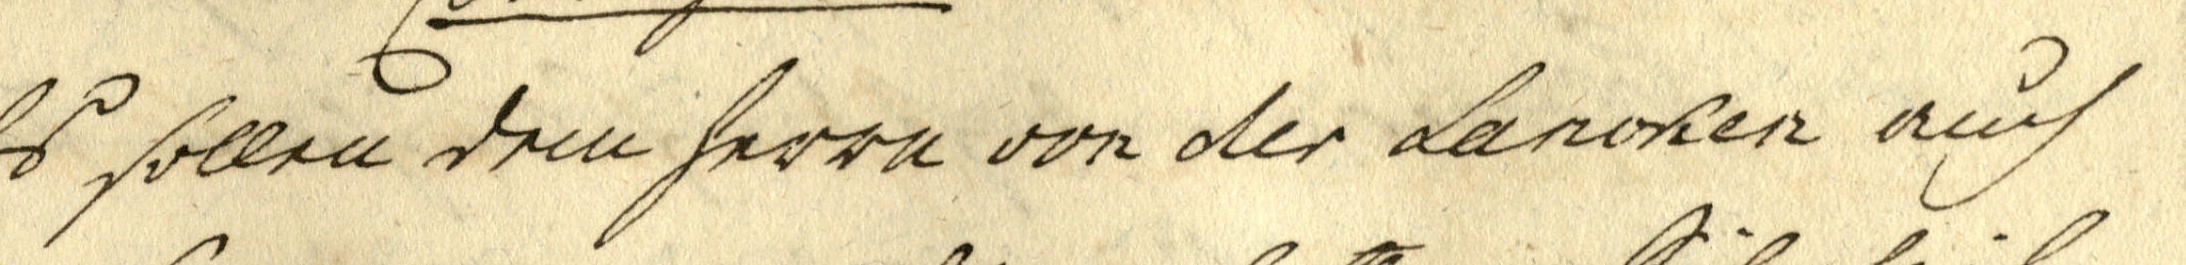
Es sollen dem Herrn von der Lancken auch
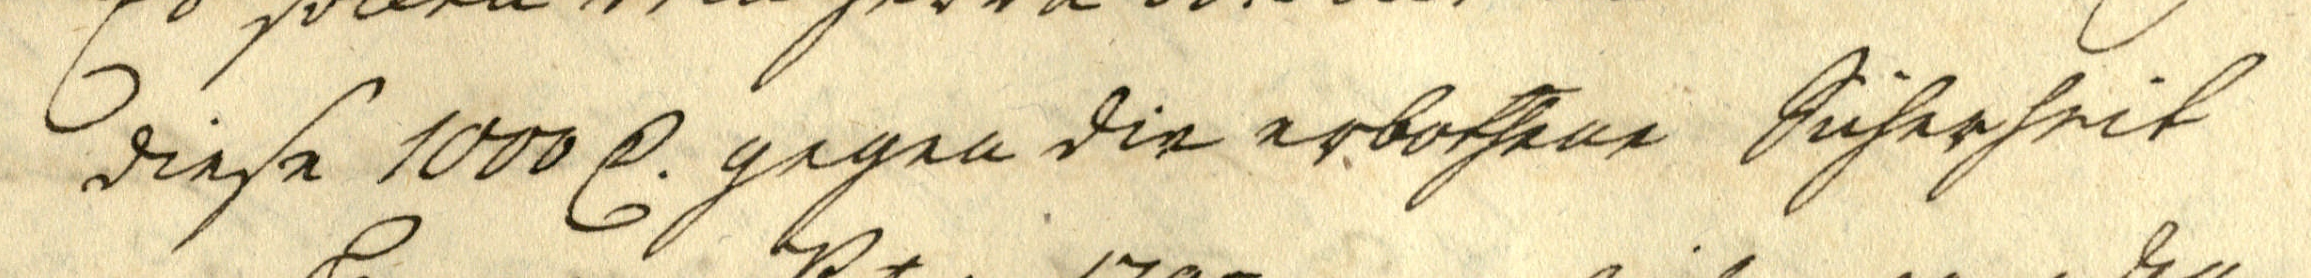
diese 1000 l. gegen die erbothene Sicherheit
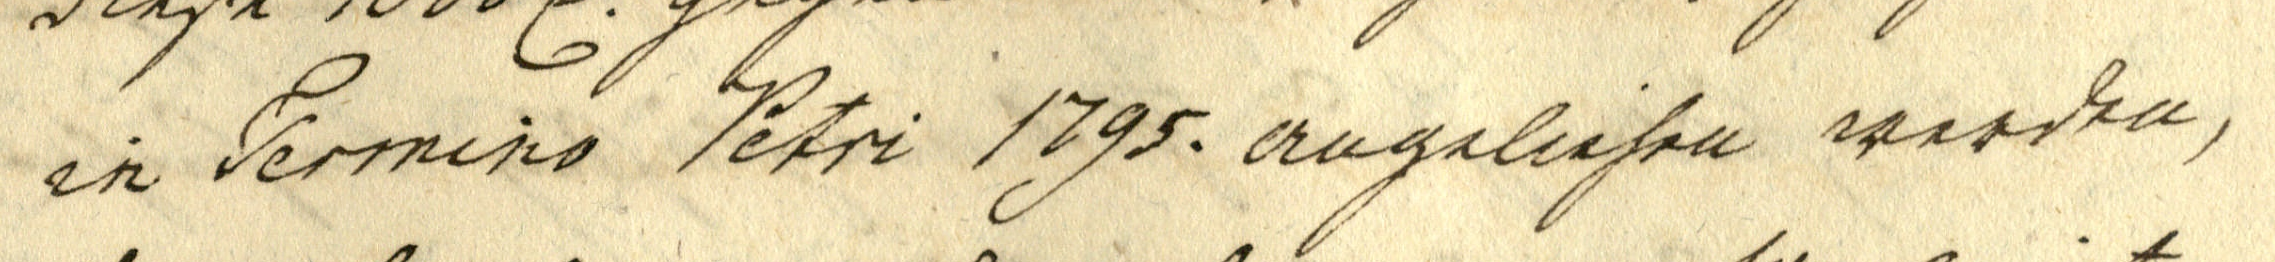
in Termino Petri 1795. angeliehen werden,
